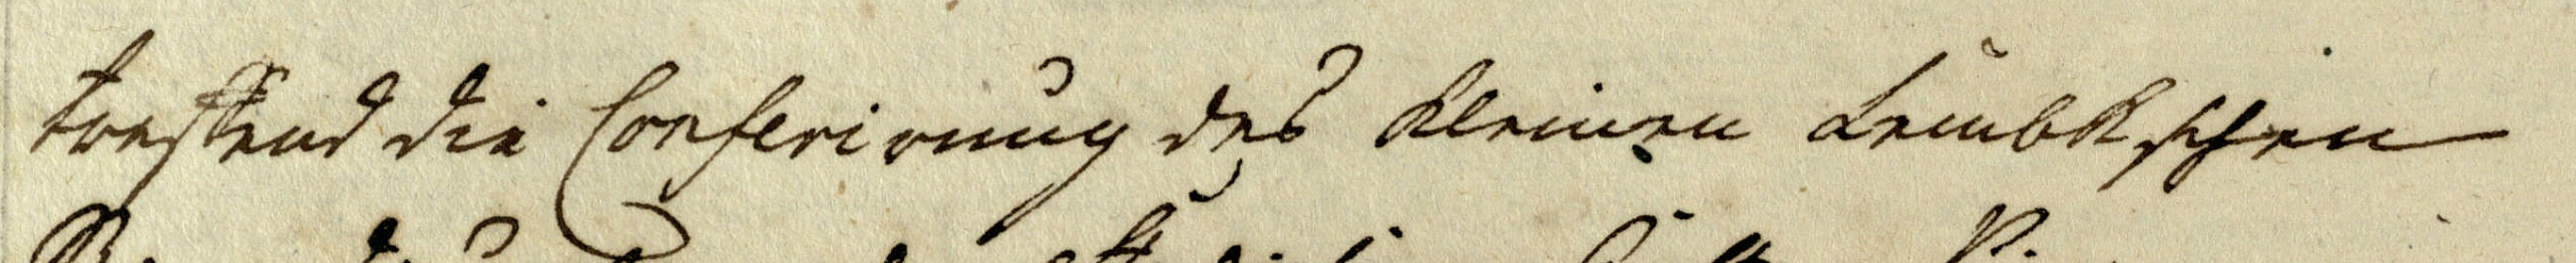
treffend die Conferirung des kleinen Lembkschen
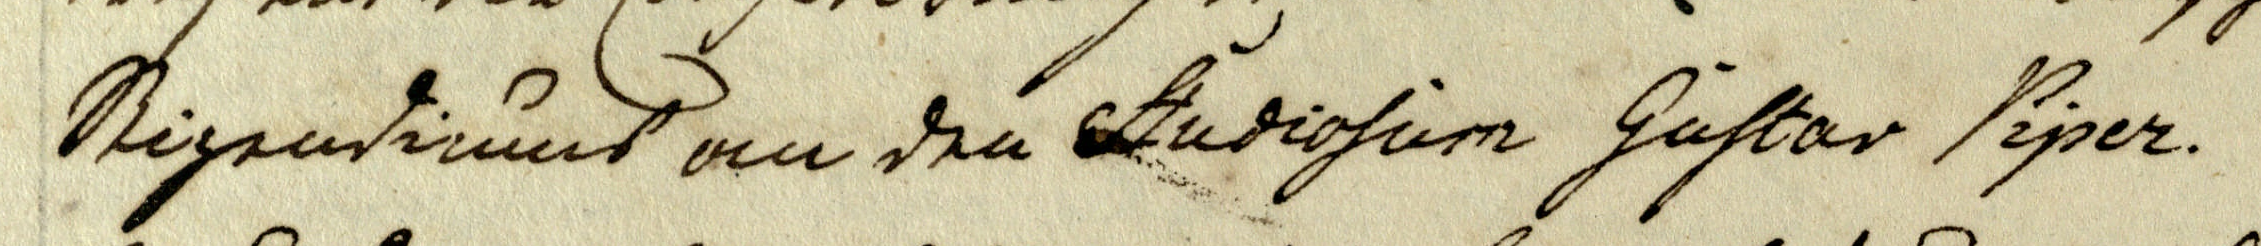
Stipendiums an den Studiosum Gustav Piper.
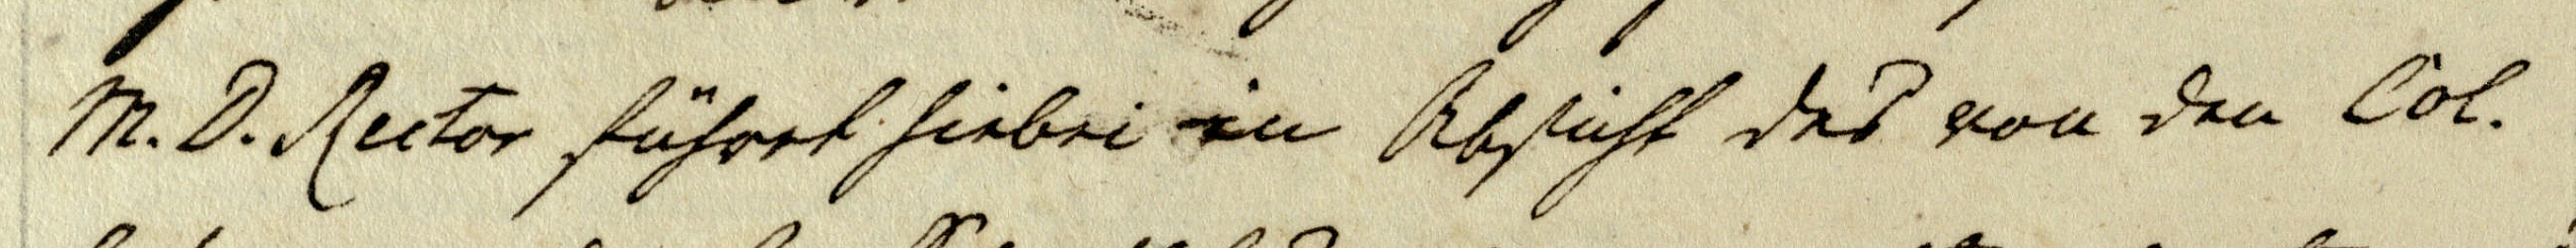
M. D. Rector führet hiebei in Absicht des von den Col¬
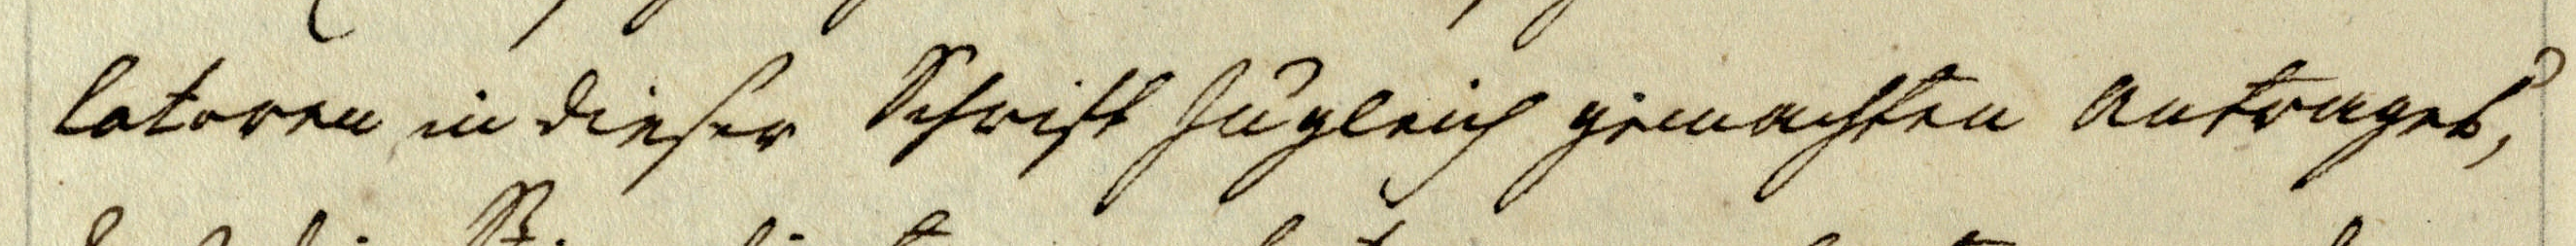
latoren in dieser Schrift zugleich gemachten Antrages,
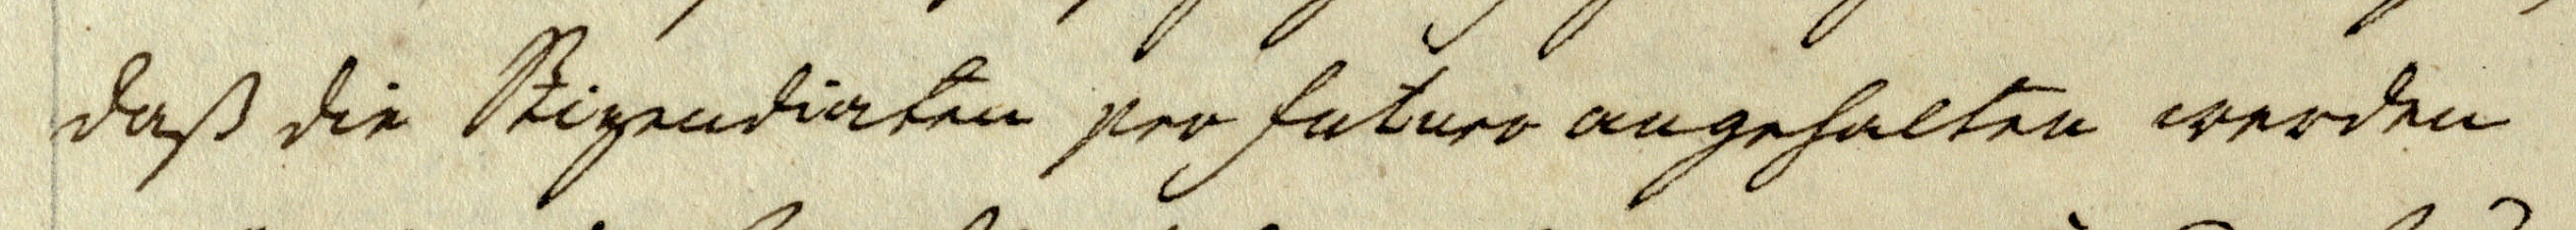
daß die Stipendiaten pro futuro angehalten werden
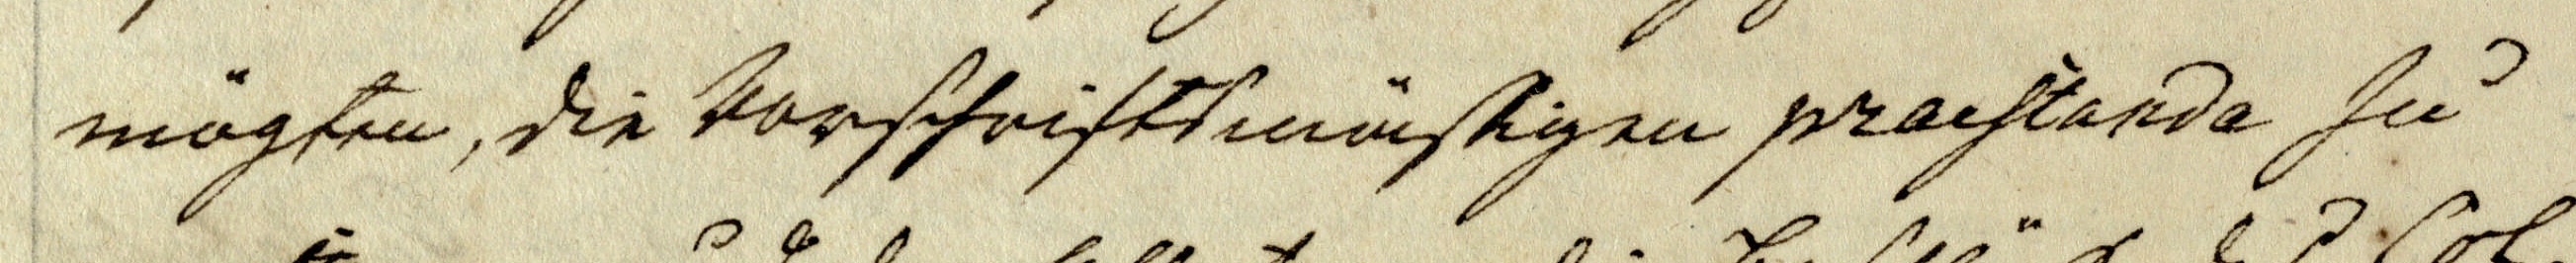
mögten, die Vorschriftsmässigen praestanda zu
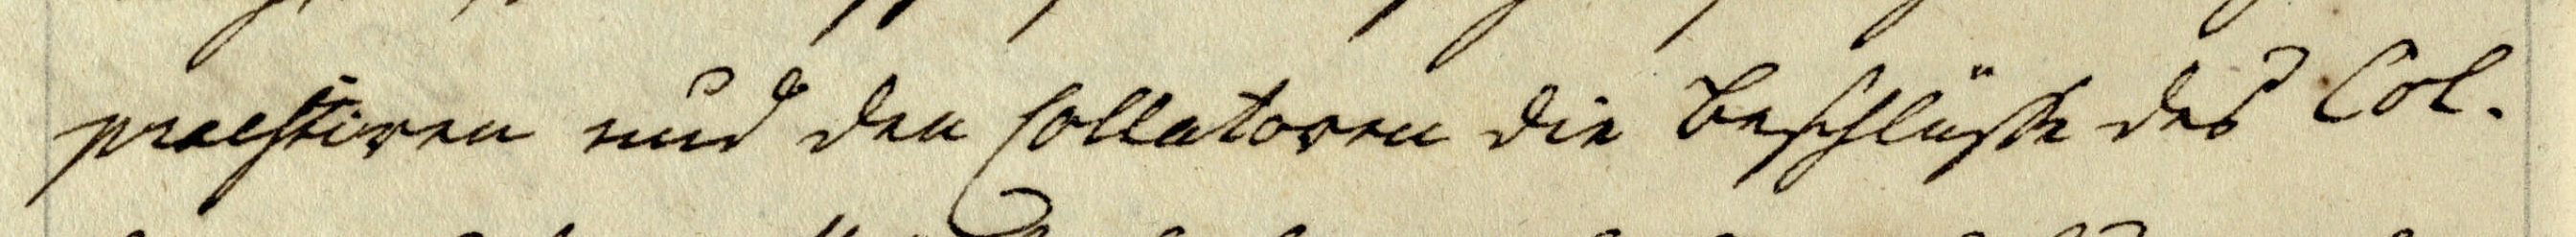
praestiren und den Collatoren die Beschlüsse des Col¬
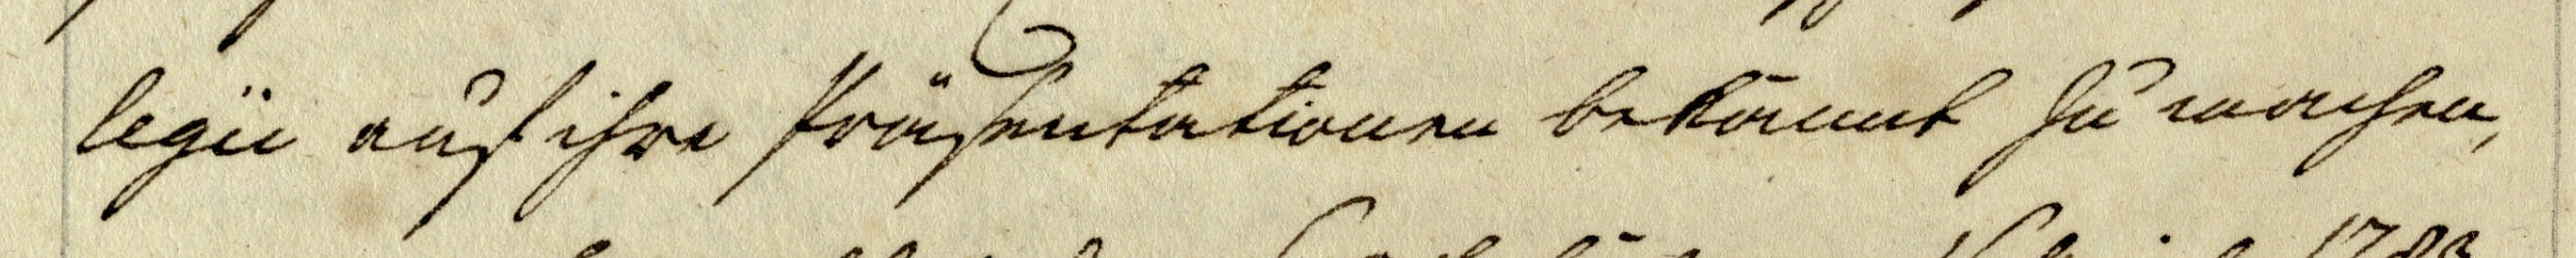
legii auf ihre Präsentationen bekannt zu machen,
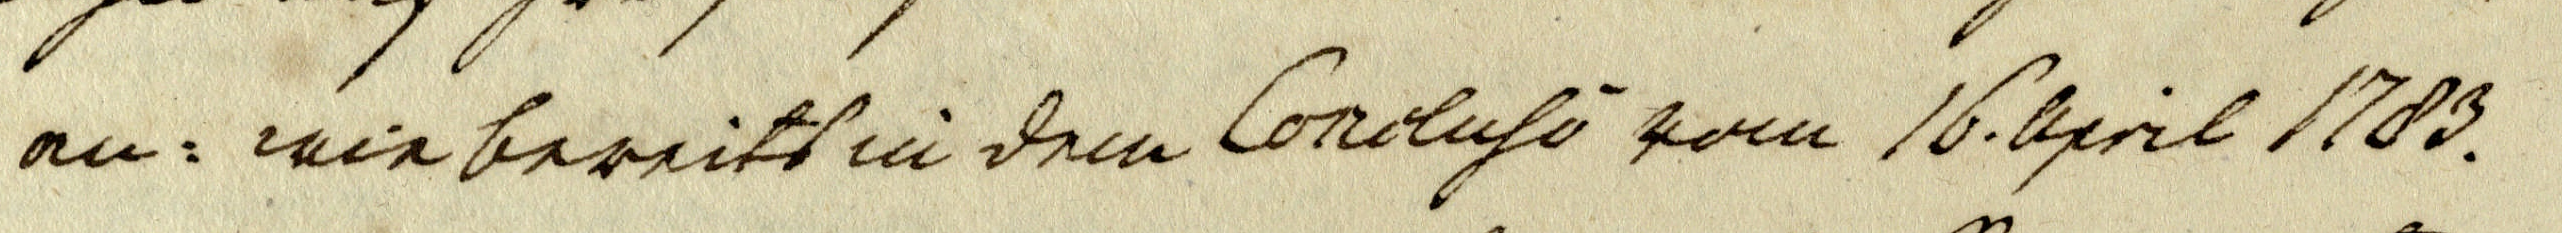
an: wie bereits in dem Concluso vom 16. April 1783.
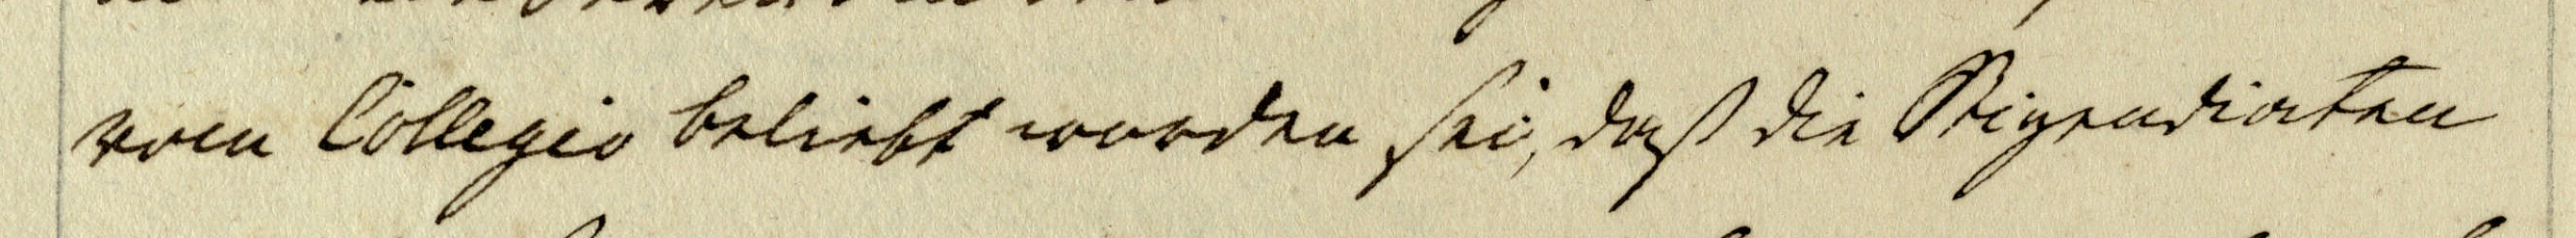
vom Collegio beliebt worden sei, daß die Stipendiaten
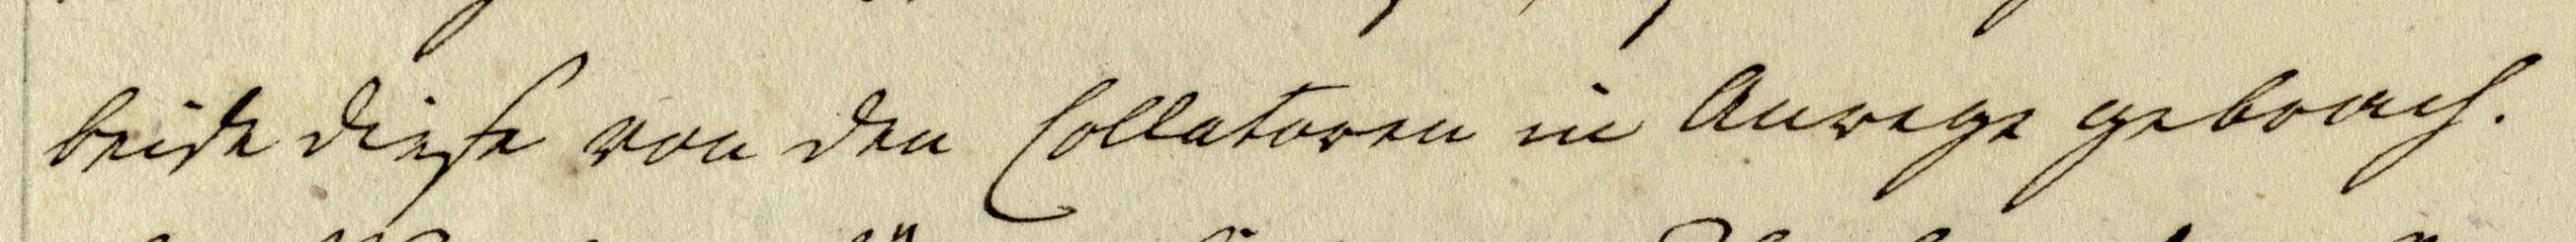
beide diese von den Collatoren in Anrege gebrach¬
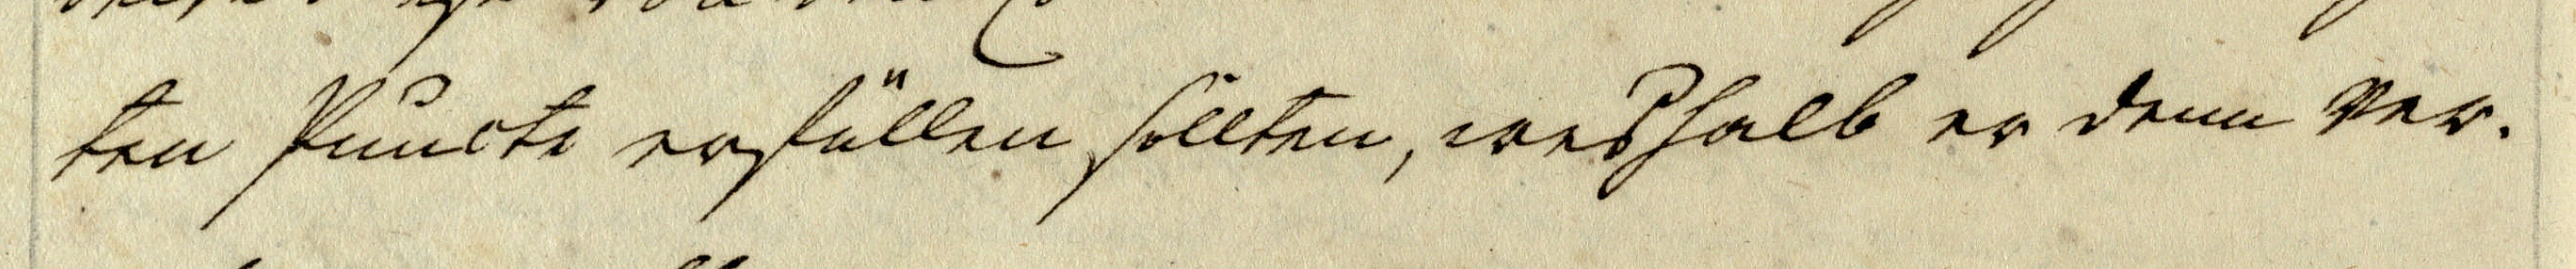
ten Puncte erfüllen sollten, weshalb er denn ver¬
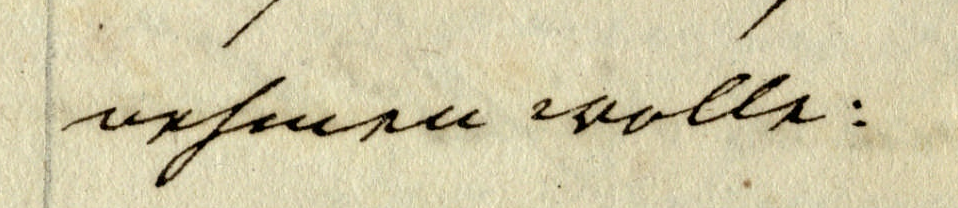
nehmen wolle:
